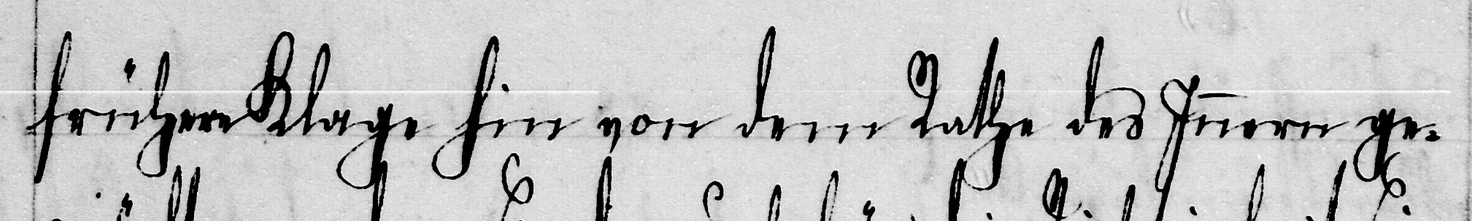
frühere Klage hin von dem Rathe des Innern ge¬
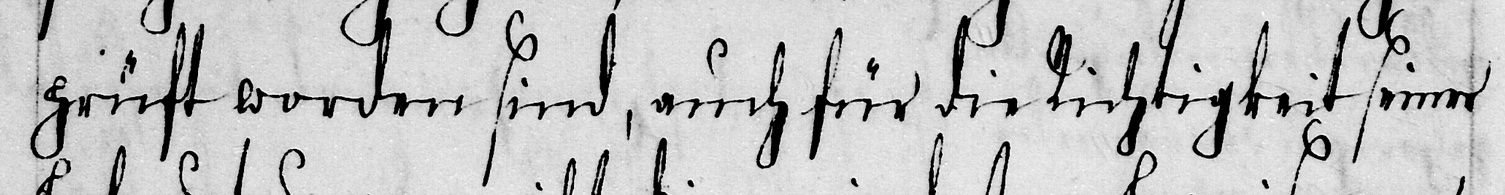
prüft worden sind, auch für die Richtigkeit seiner
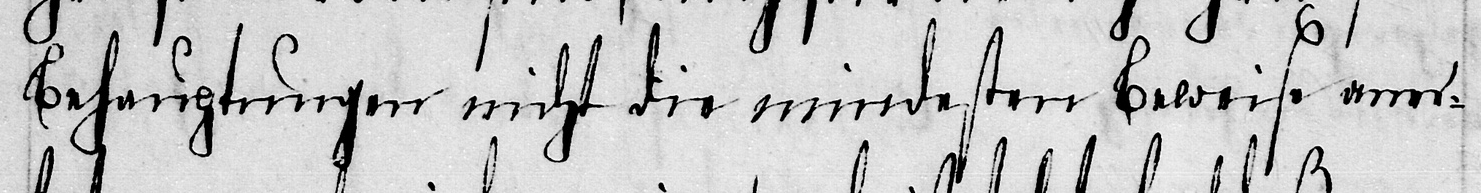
Behauptungen nicht die mindesten Beweise aner¬
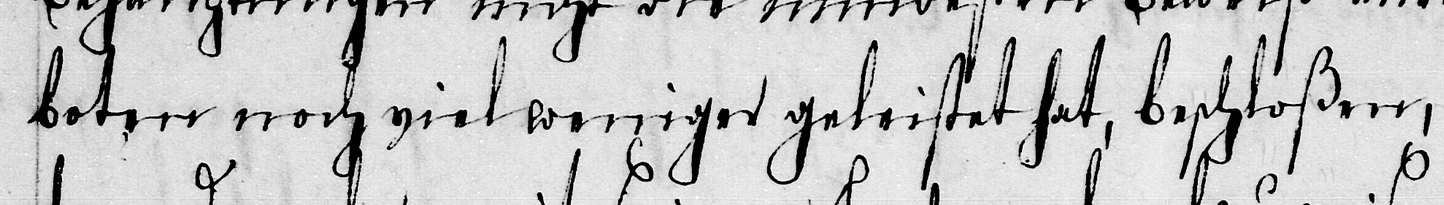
boten noch viel weniger geleistet hat, beschloßen,
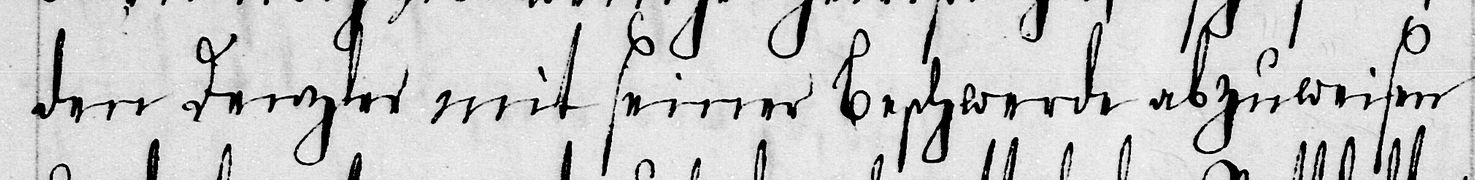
den Denzler mit seiner Beschwerde abzuweisen
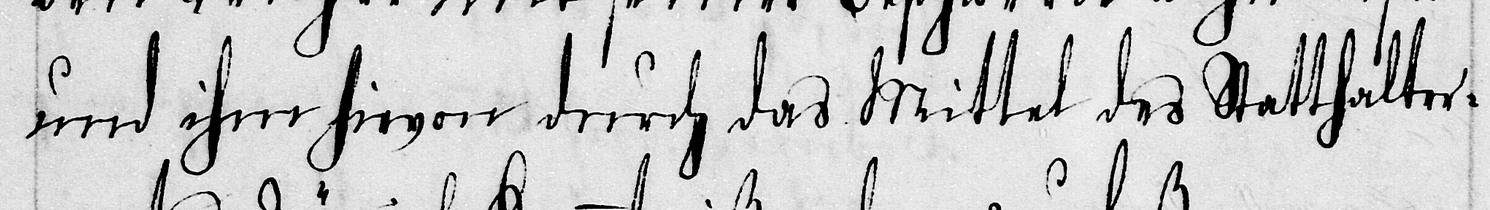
und ihm hievon durch das Mittel des Statthalter¬
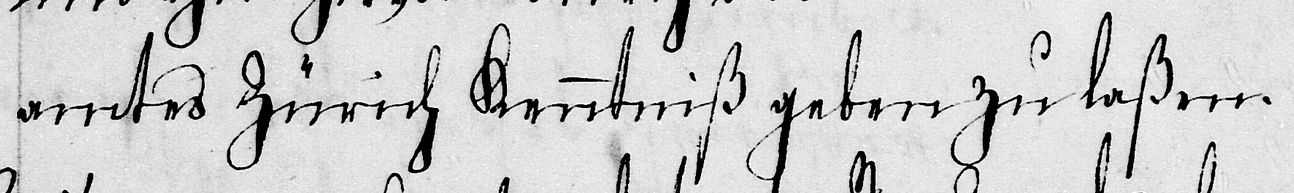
amtes Zürich Kenntniß geben zu laßen.
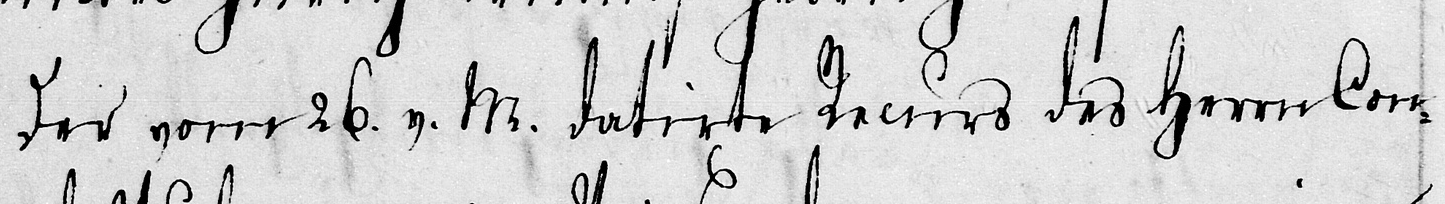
Der vom 26. v. M. datirte Recurs des Herrn Con¬
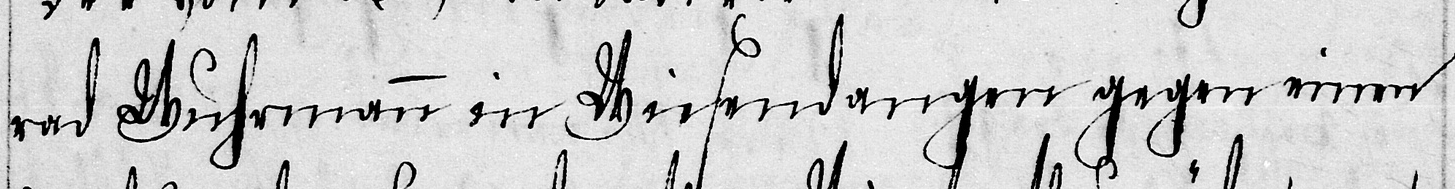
rad Wuhrmann in Wiesendangen gegen einen
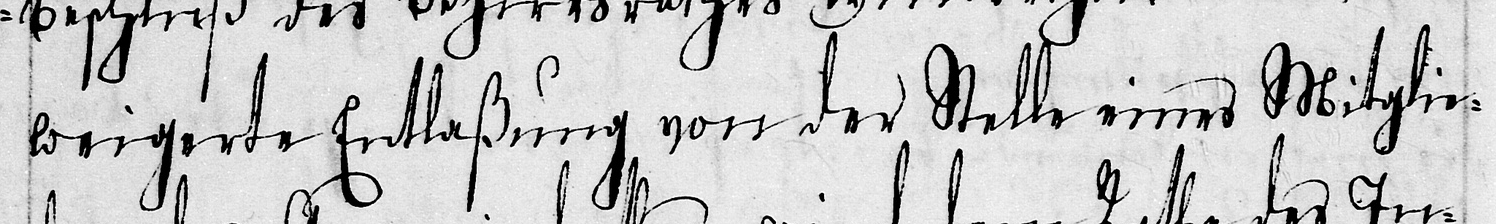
weigerte Entlaßung von der Stelle eines Mitglie¬
